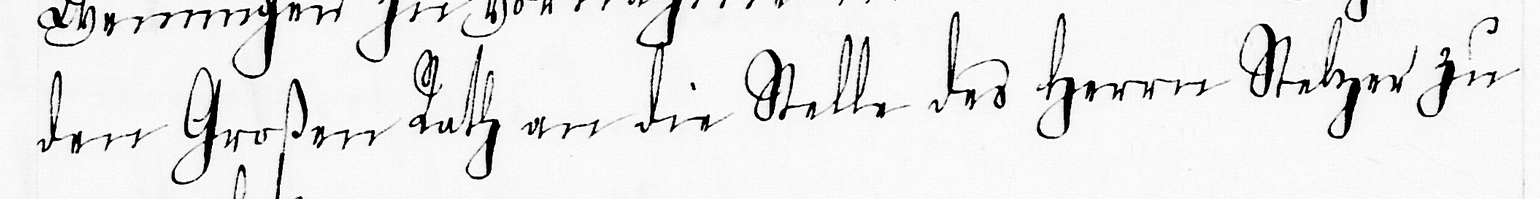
den Großen Rath an die Stelle des Herrn Stelzer zu
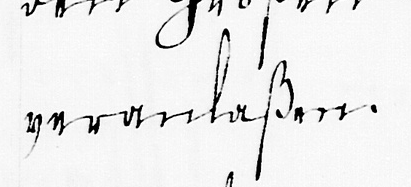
veranlaßen.
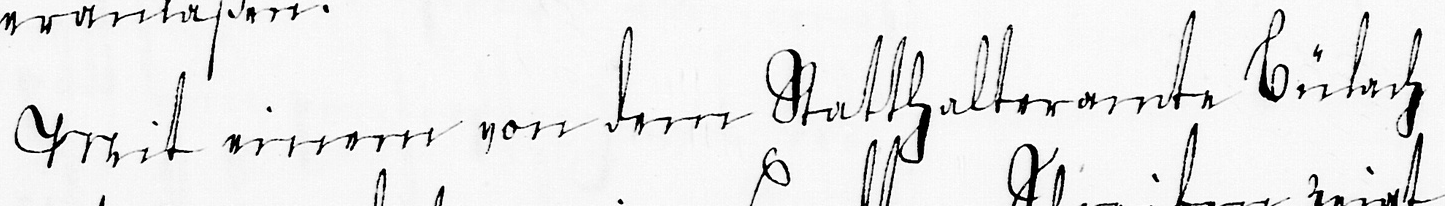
Mit einem von dem Statthalteramte Bülach
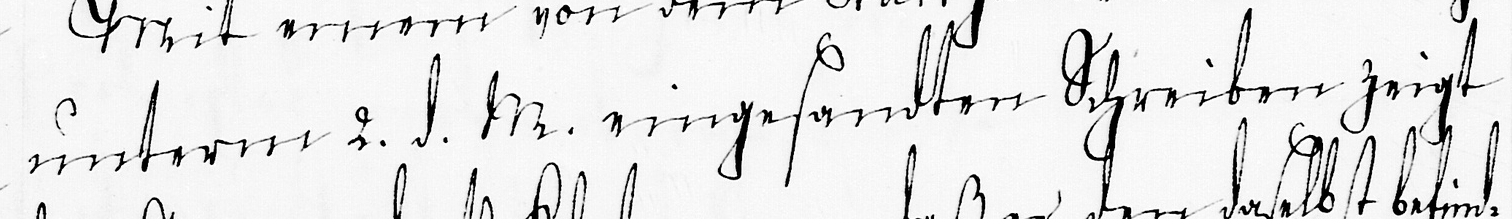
unterm 2. d. M. eingesandten Schreiben zeigt
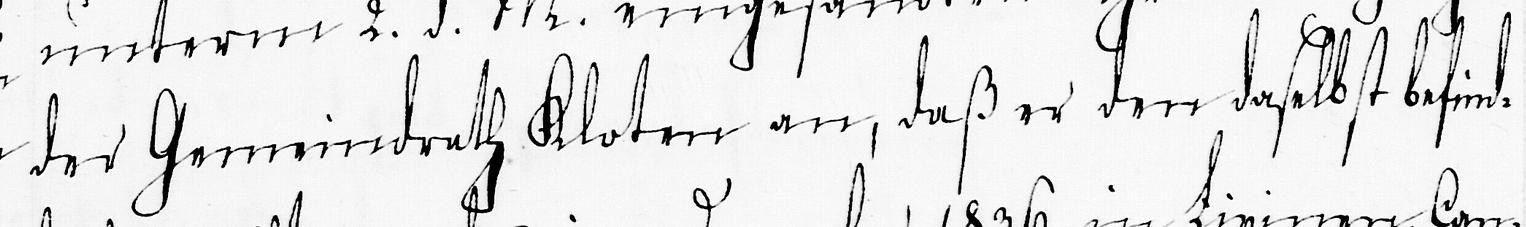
der Gemeindrath Kloten an, daß er den daselbst befin¬
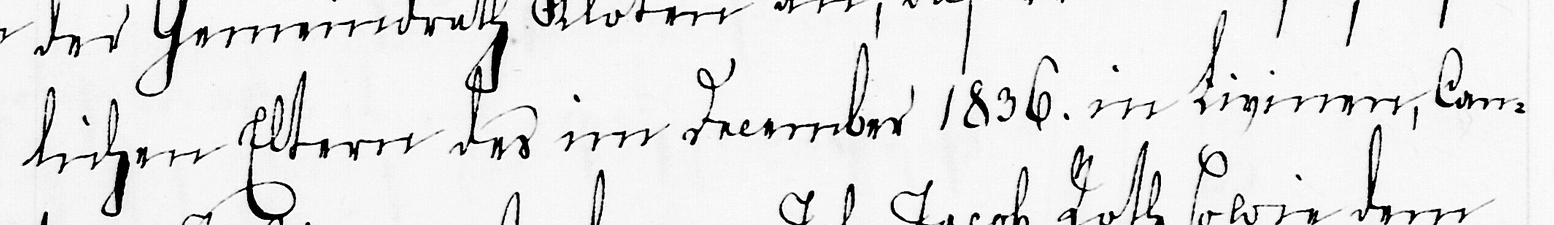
dlichen Eltern des im December 1836. in Livinen, Can¬
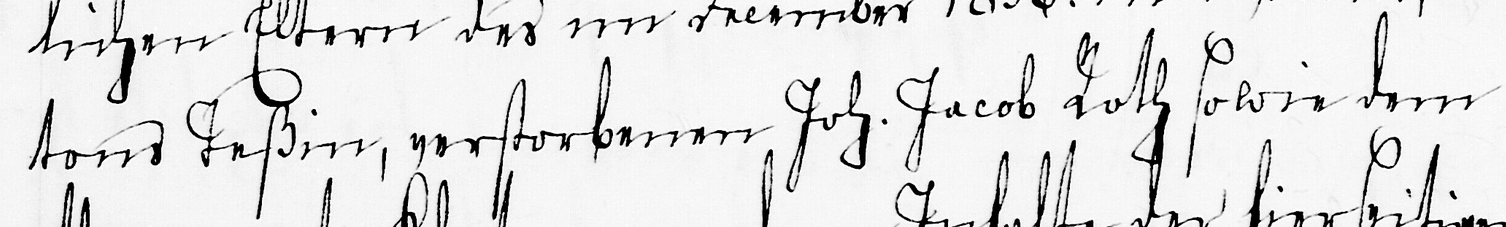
tons Teßin, verstorbenen Joh. Jacob Roth sowie dem
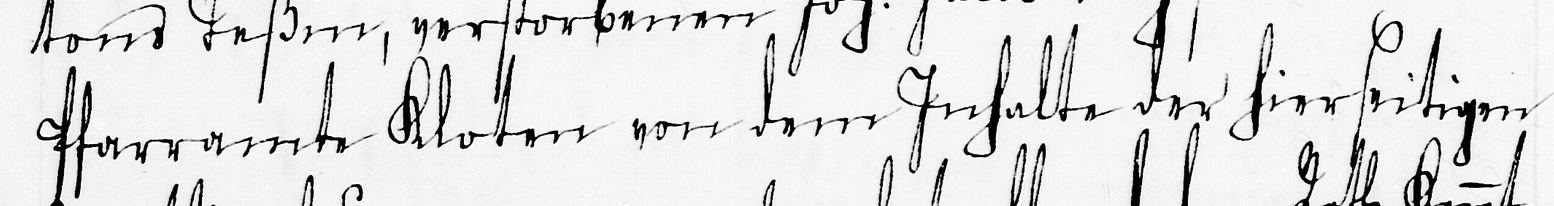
Pfarramte Kloten von dem Inhalte der hierseitigen
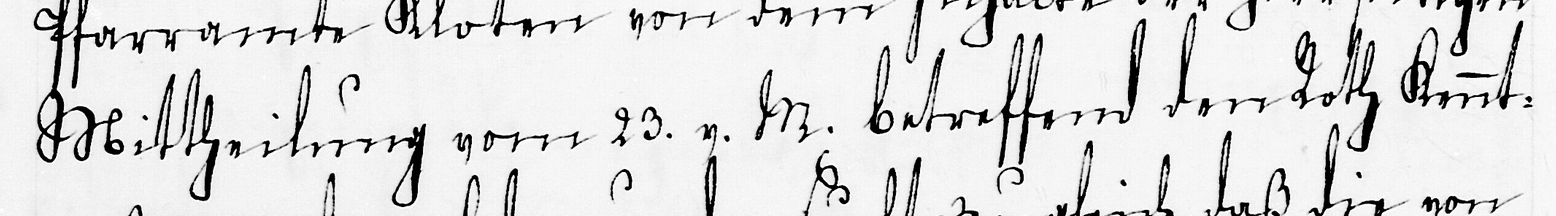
Mittheilung vom 23. v. M. betreffend den Roth Kennt¬
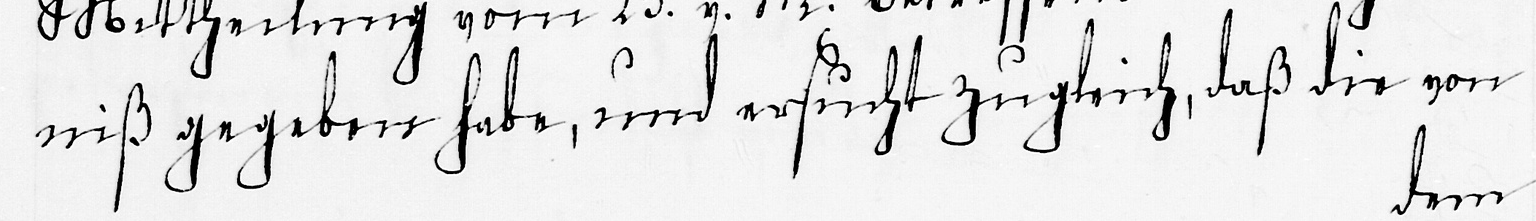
niß gegeben habe, und ersucht zugleich, daß die von
